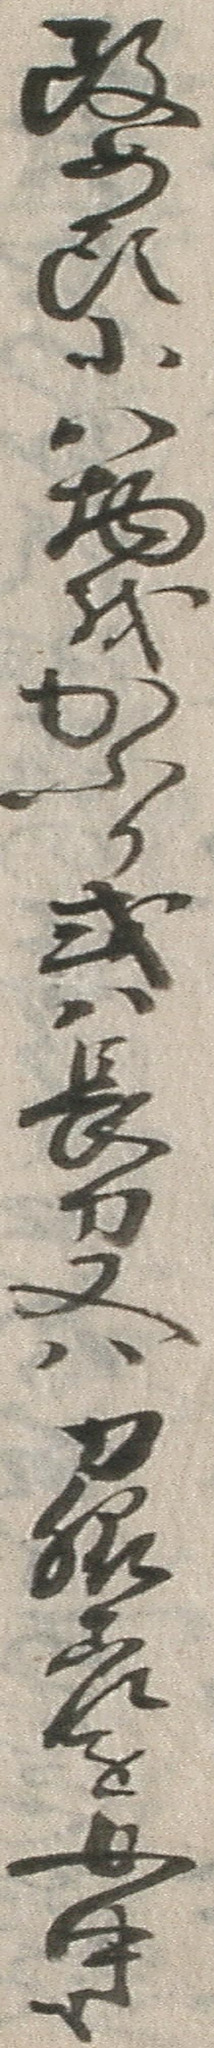改め頭には物をかふり或は長刀又は刀脇差を女中も
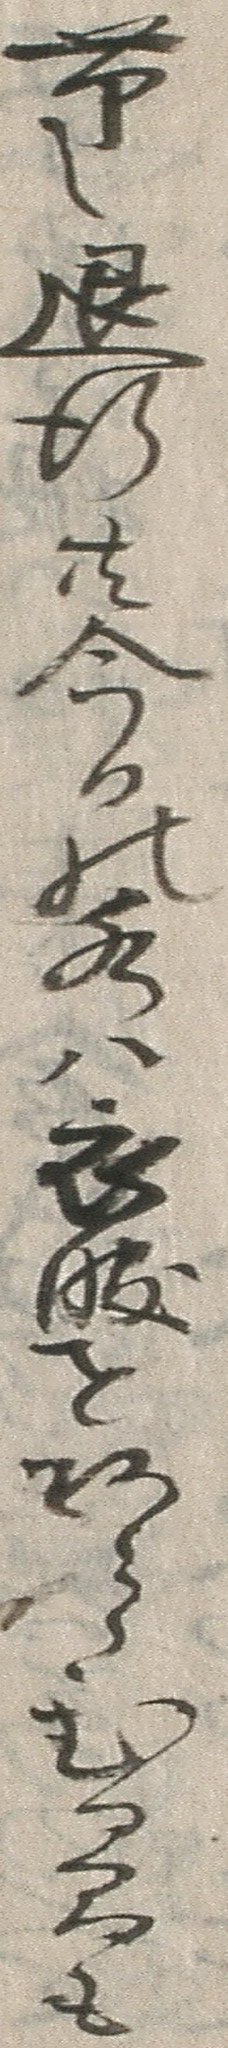帯し退行共今日の水は衣服をあらたむる間も
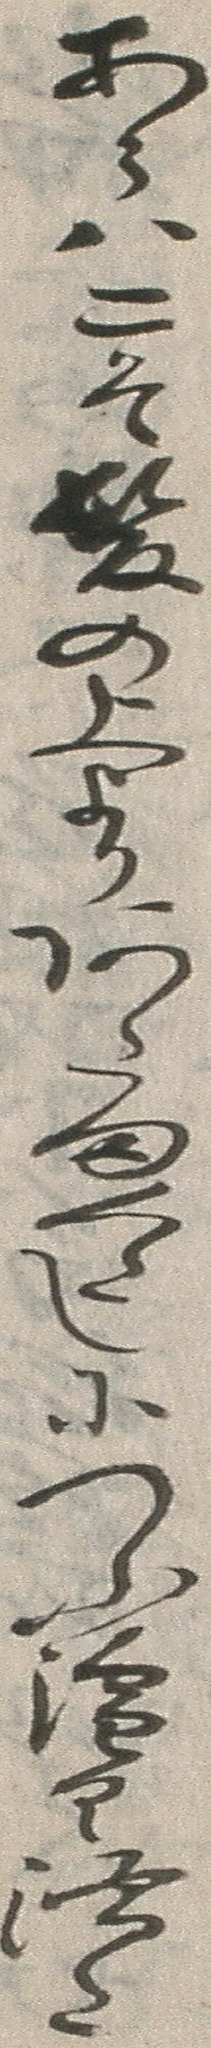あらはこそ髪の上よりあたまくたしにつふ濡る濡た
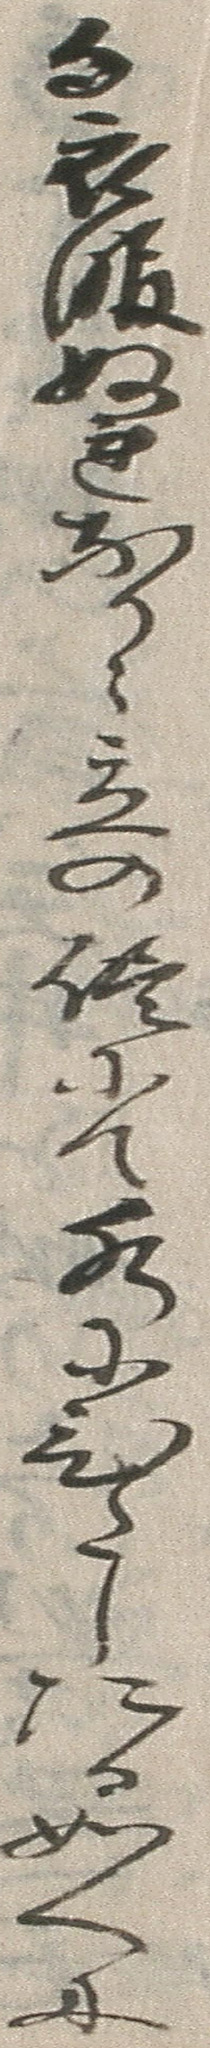る衣服ぬれなり二立の侭にて水にひたしたる如くに
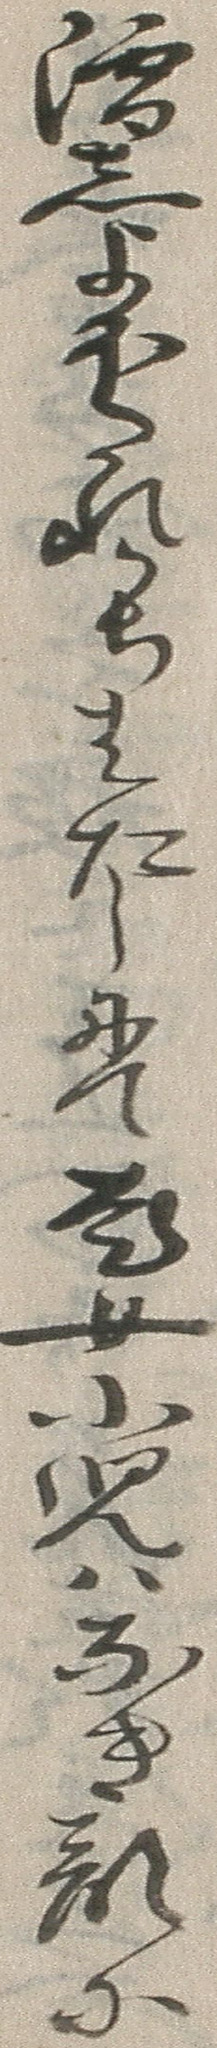濡しよほたれかちはたしにて老女小児はなき顔に
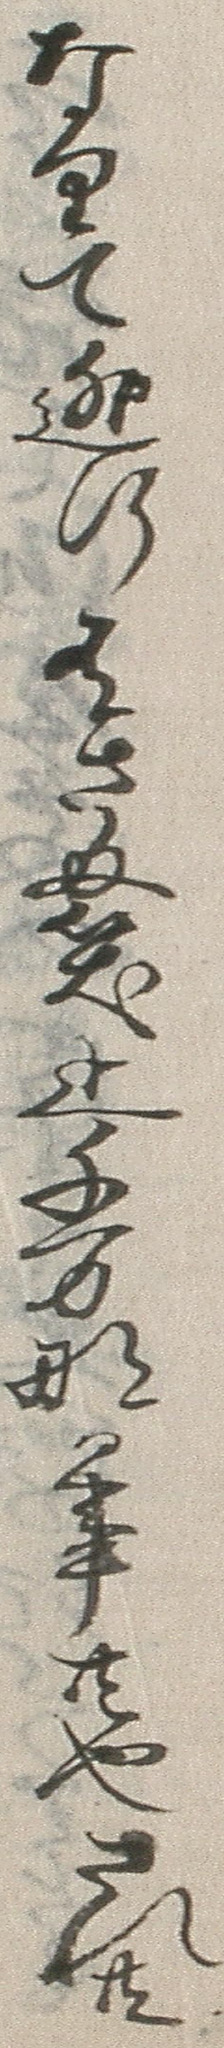なりて逃行有さま笑止千万なる事共也され共
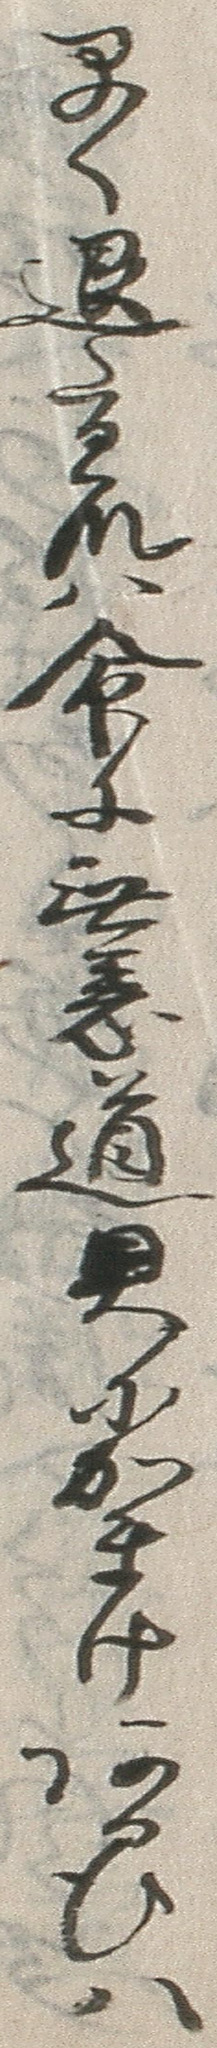早く退たる衆は命に無恙道具にかまけあるひは
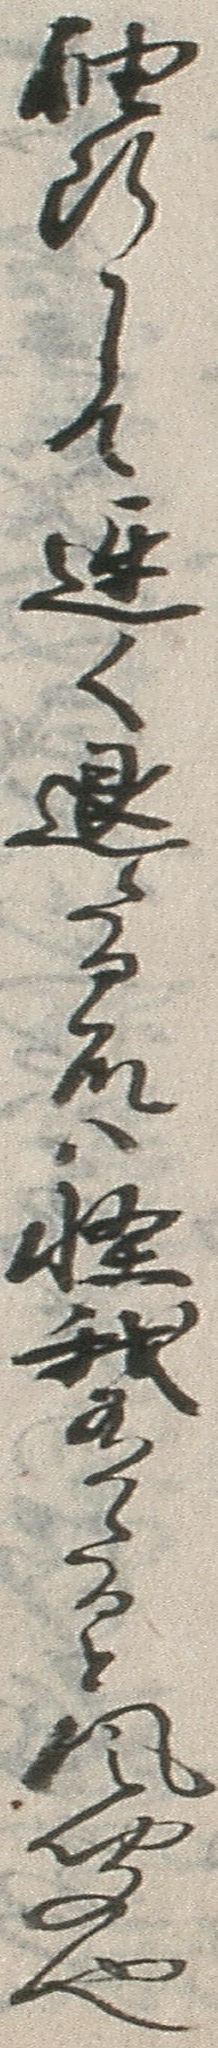油断して遅く退たる衆は怪我有たると風聞也
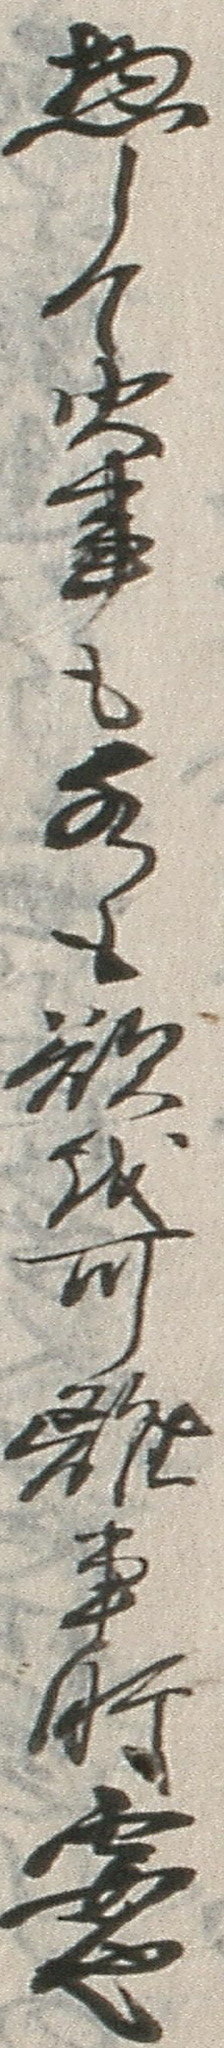惣して火事も水も欲を可離事肝要也
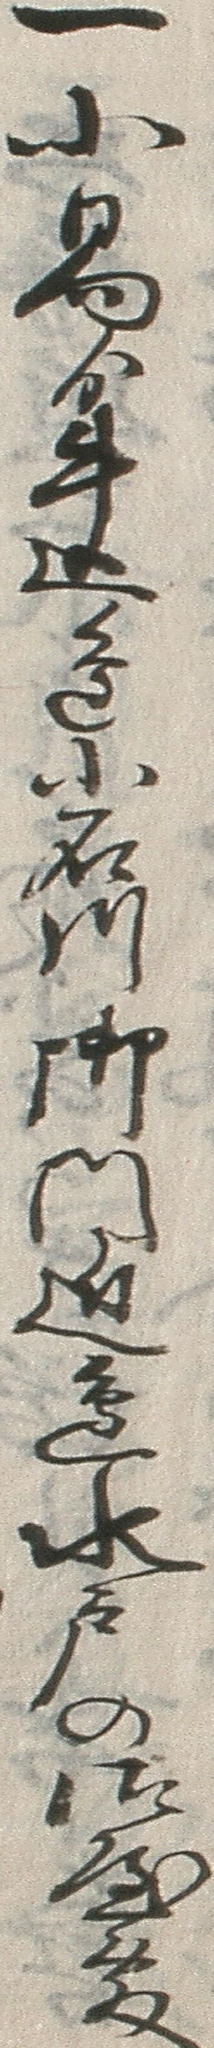一小日向ゟ牛込辺小石川御門近辺水戸の御屋敷
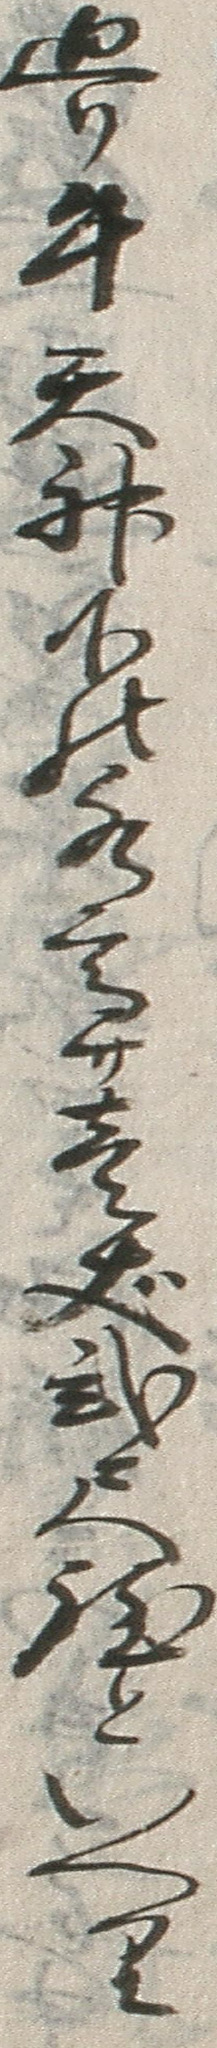廻り牛天神下の水高サ壱丈弐尺程といへり
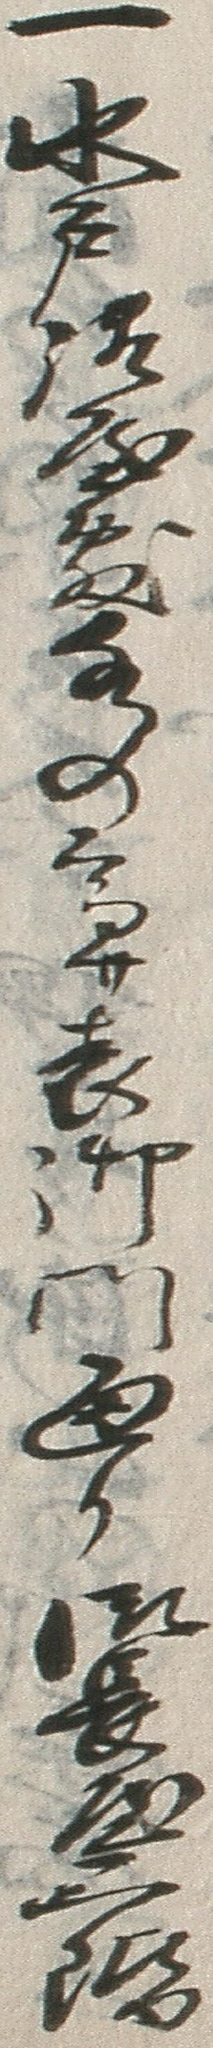一水戸御屋敷水の高サ表御門通り御長屋二階
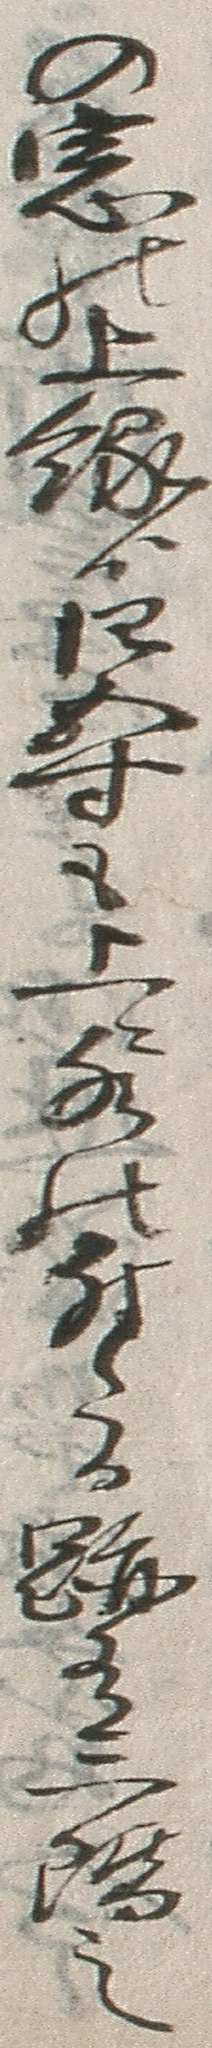の窓の上縁より四五寸も上に水の付たる跡有二階之
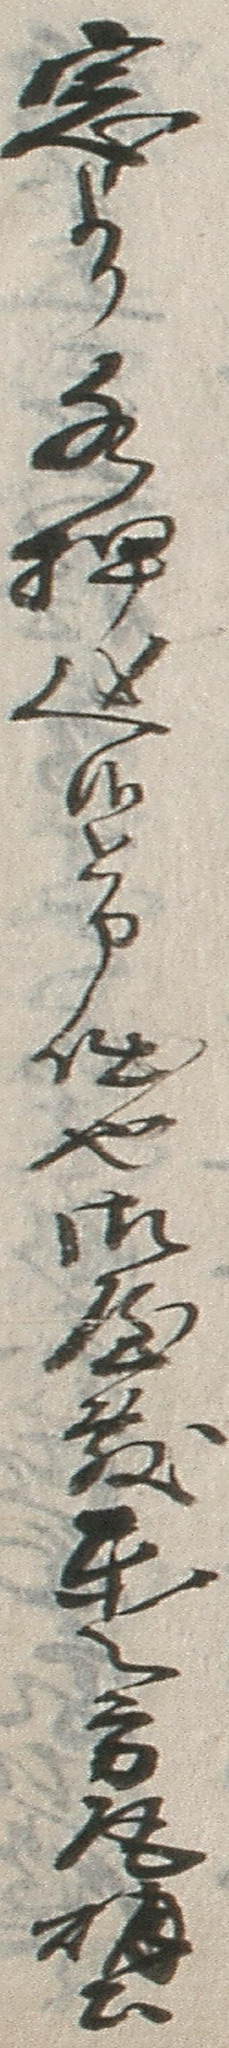窓より水押込候と申咄也御屋敷東の方瓦壁

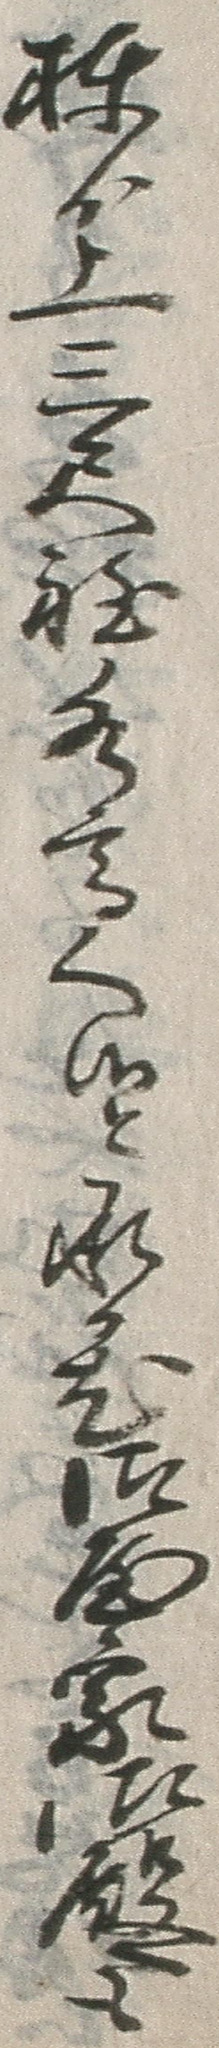棟ゟ上三尺程水高く候と承る尤御屋家御殿へも
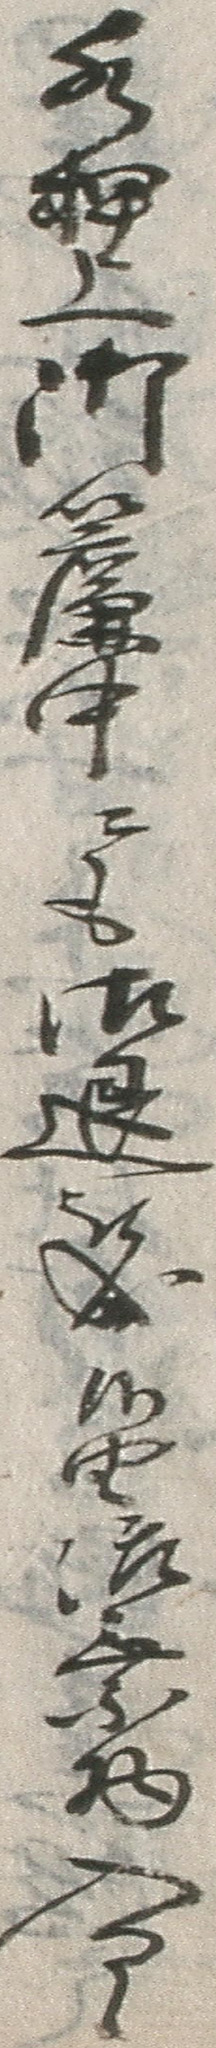水押上御簾中にも御退被成候由御乗物入るゝ
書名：享保十三年江戸洪水記
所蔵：東京大学地震研究所図書室 Earthquake Research Institute Library, The University of Tokyo, JAPAN
